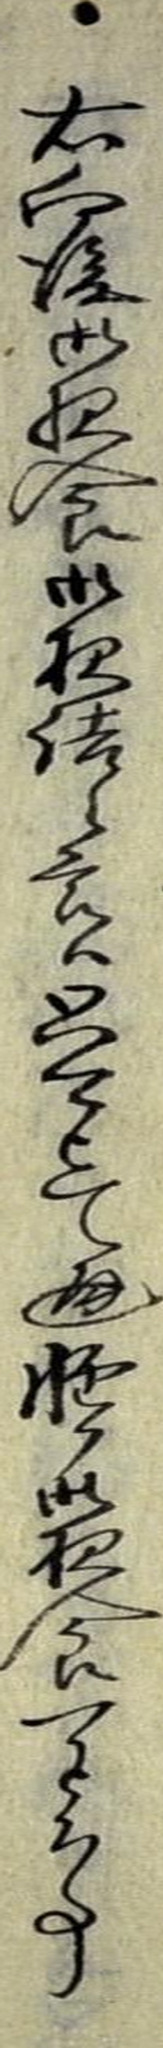右向後御夜食御夜詰之節ハ只今迄之通軽ク御夜食可被下事
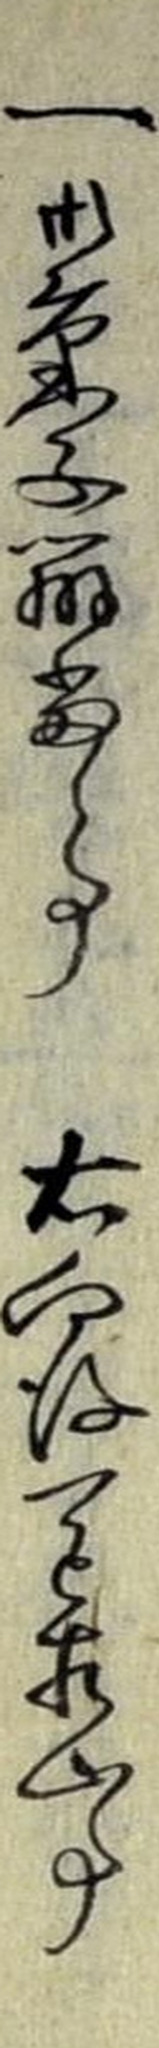一御菓子弁当之事右向後可被相止事
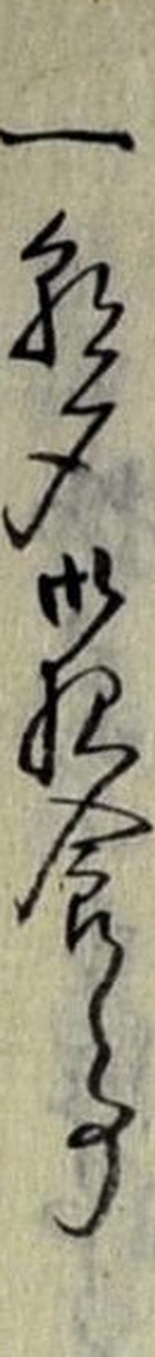一朝夕御夜食之事
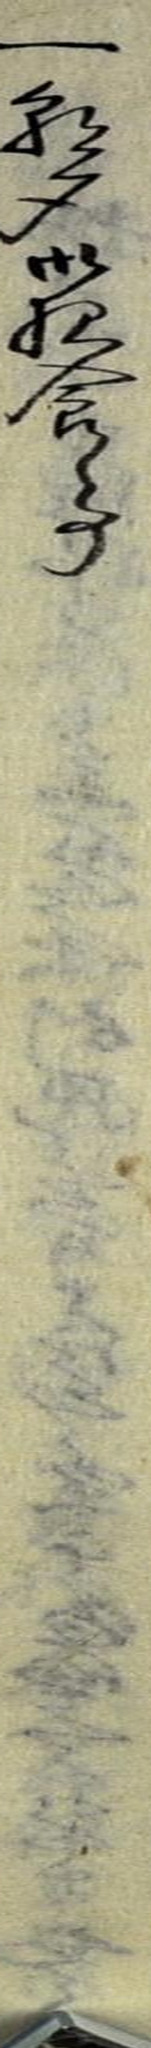一朝夕御夜食之事
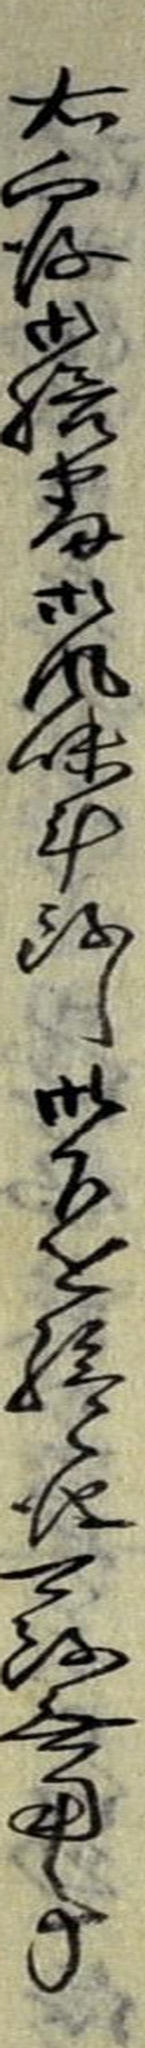右向後御膳番御風味斗致し御下を給候儀可致無用事
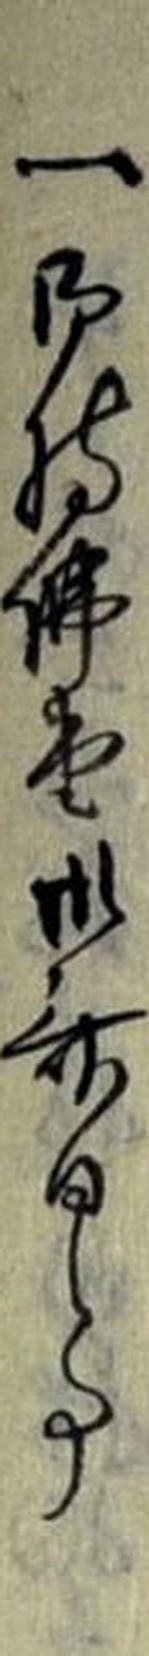一御持仏堂御斎日之事
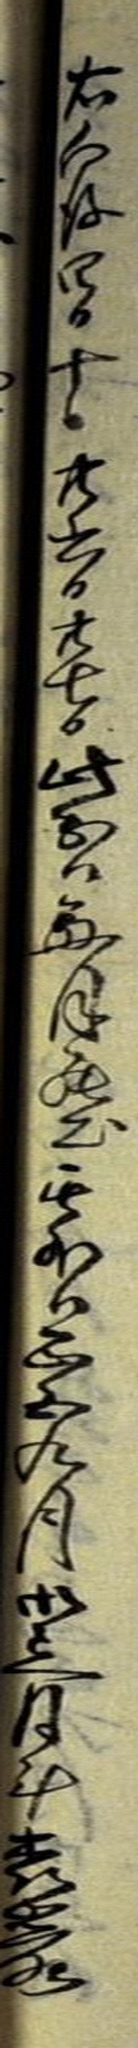右向後四日十日廿六日廿七日此分ハ毎月罷出其外ハ正五九月御忌月斗森厳
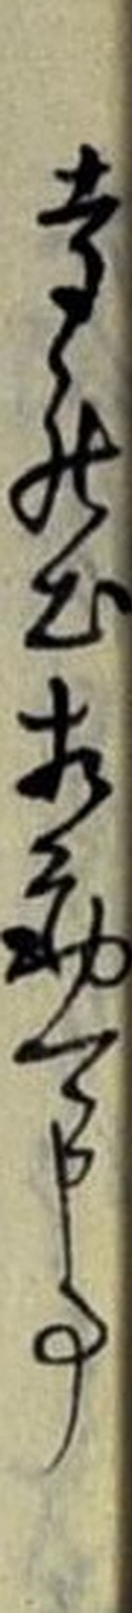寺へ罷出相勤可申事
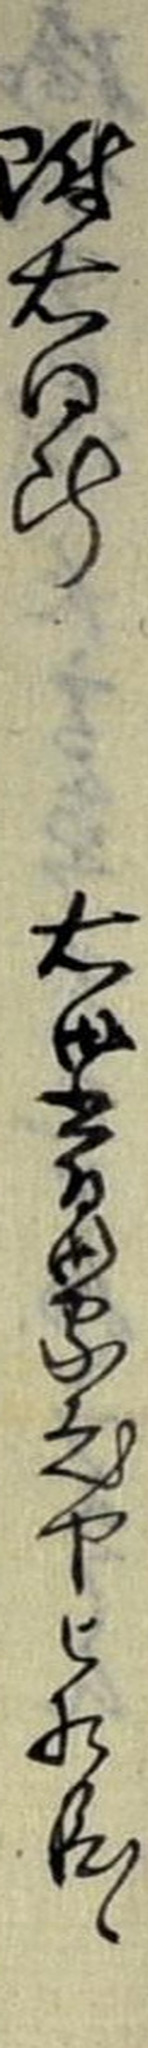附右同断右御書付御家老中被相渡候
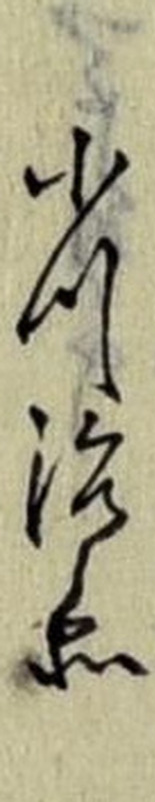小川治兵衛
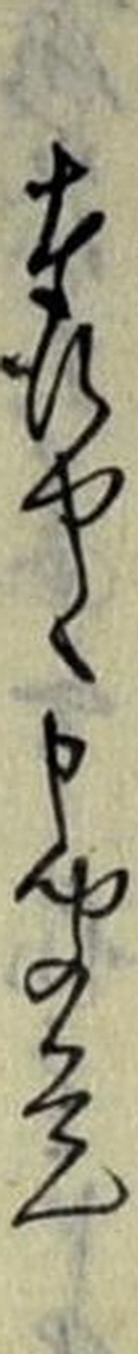奉行中へ申聞覚
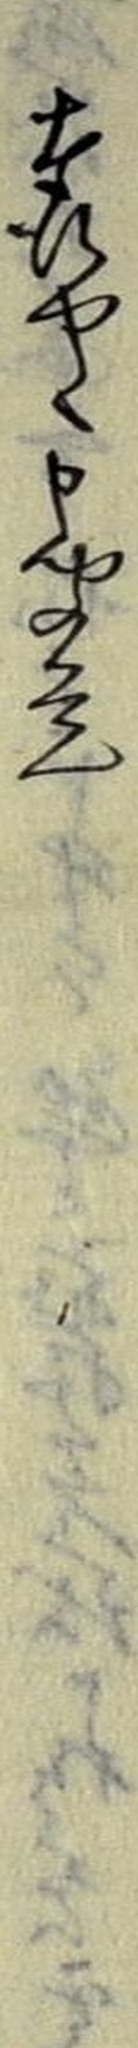奉行中へ申聞覚
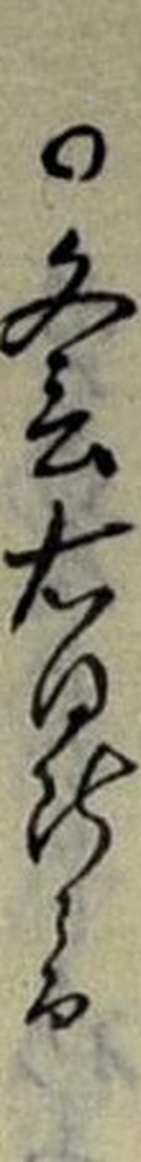〇文言右同断ニ而
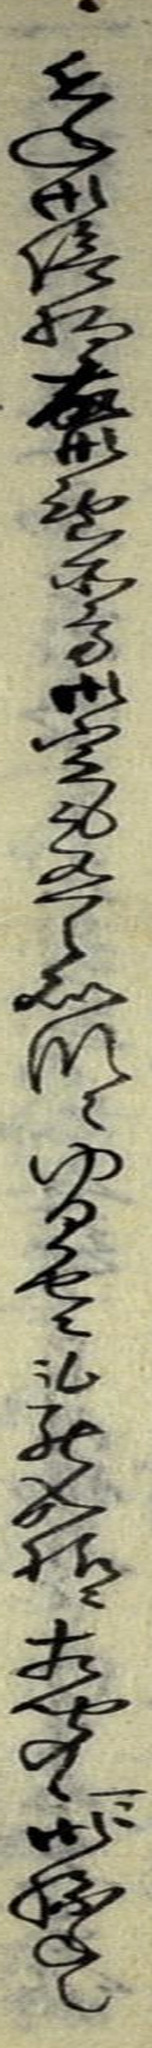近年御倹約故御台所方御定も有之処段々ゆるかせニも罷成様ニ相聞候御勝手之
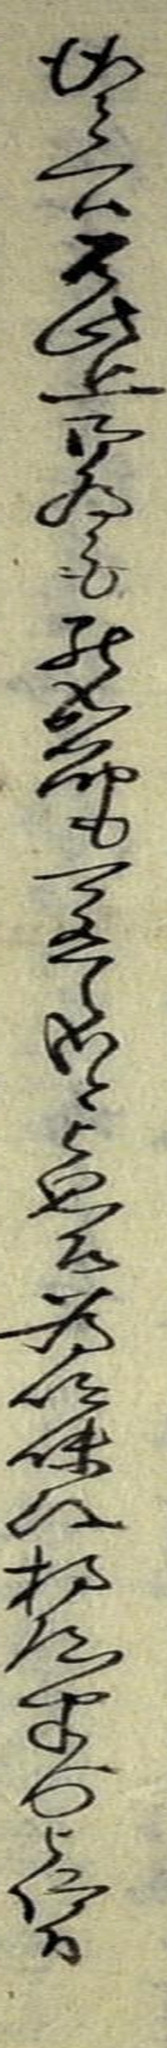趣ニ候ヘハ乍此上御為ニも罷成筋も可有之哉と被思召為吟味役栃屋半右衛門被仰付
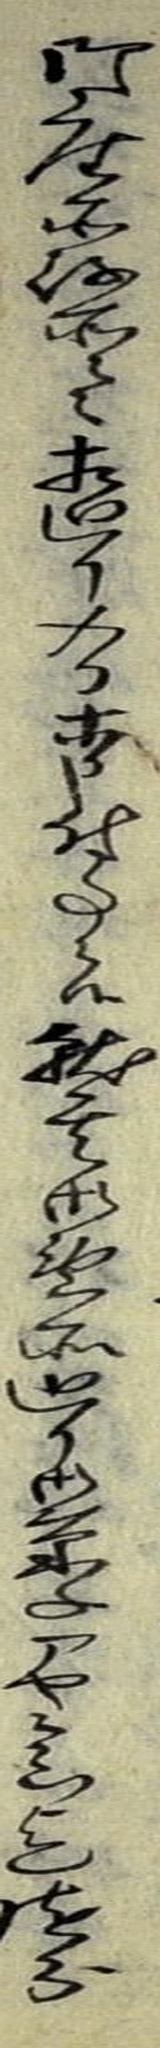御座所役所々々相廻り〆り等申付事ニ候就其御台所廻り御菓子部屋ニ至迄随分
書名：命令之部 一
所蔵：福井県文書館 Fukui Prefectural Archives
